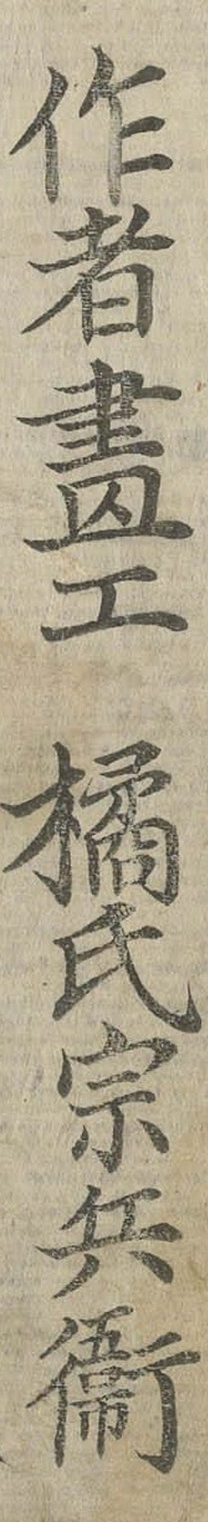作者画工橘氏宗兵衛
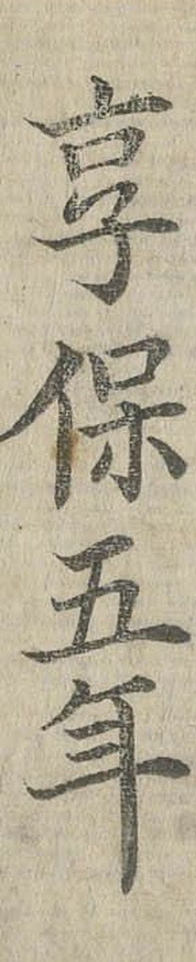享保五年
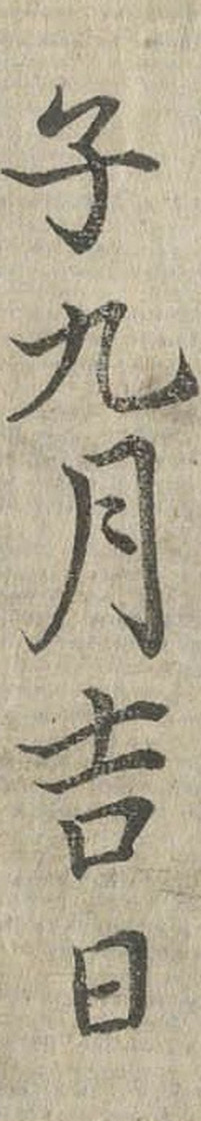子九月吉日
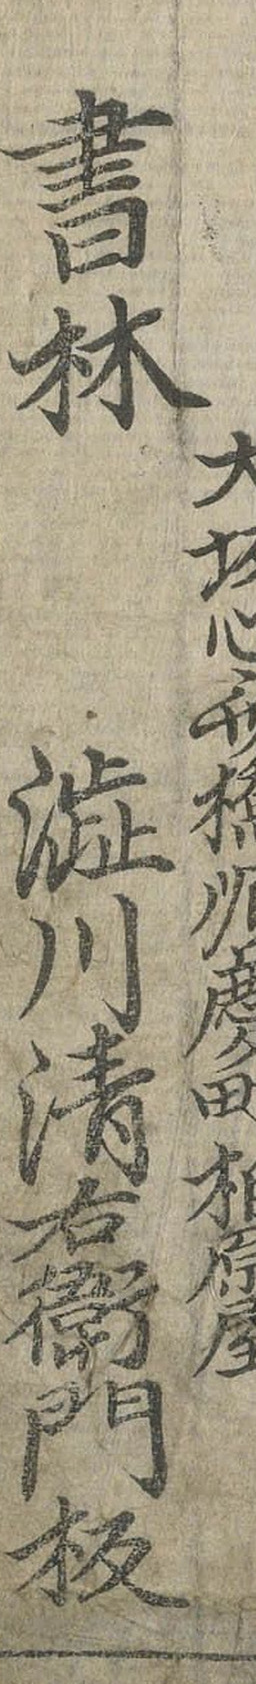書林渋川清右衛門板
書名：絵本写宝袋 9巻 9之巻下
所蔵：東京学芸大学教育コンテンツアーカイブ
